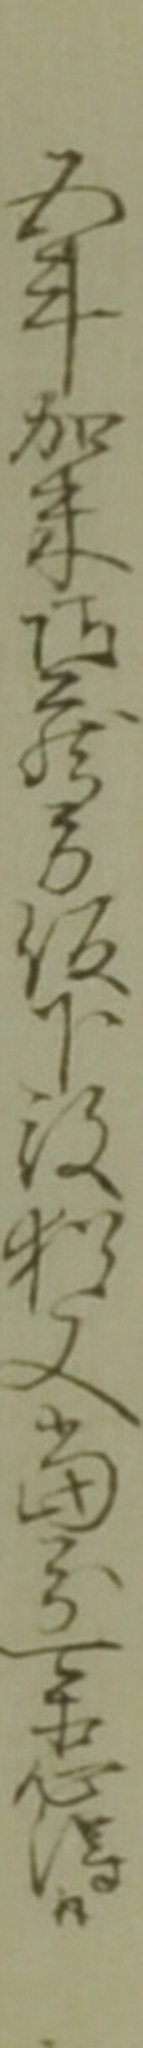五斗加米御蔵方仮下役猶又当分可相心得候
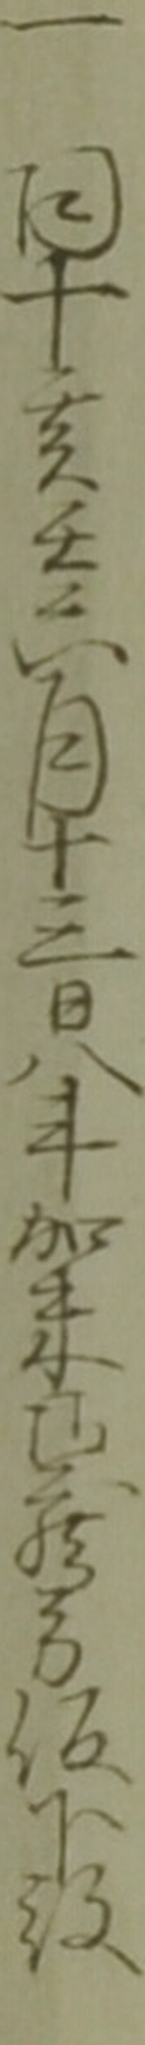一同十亥閏六月十三日八斗加米御蔵方仮下役
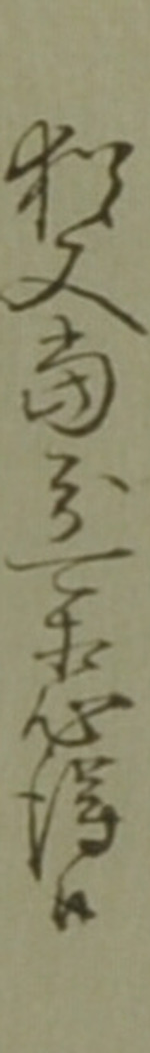猶又当分可相心得候
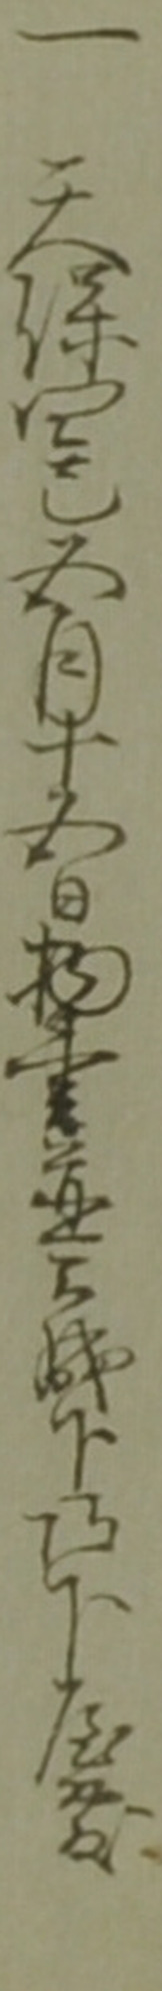一天保四巳五月十五日物書並被成下御下屋敷
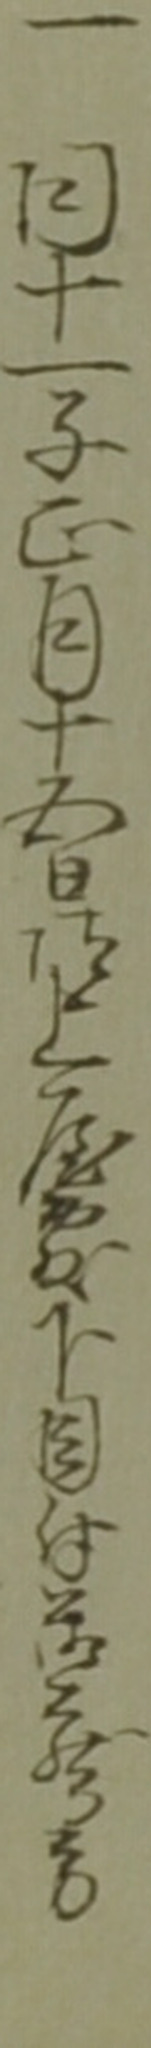一同十一子正月十五日御上屋敷下目付御蔵方
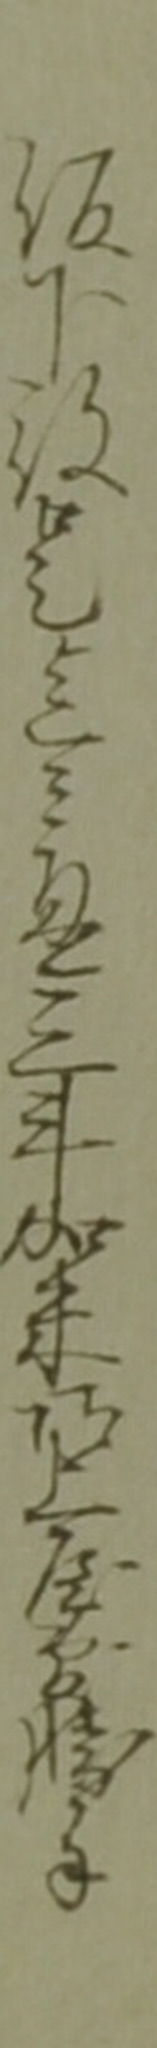仮下役是迄之通三斗加米御上屋敷勝手
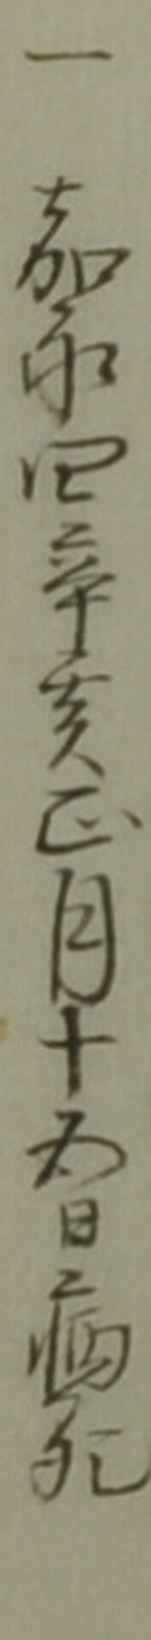一嘉永四辛亥正月十五日病死
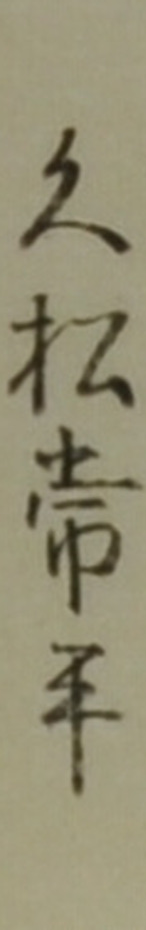久松常平
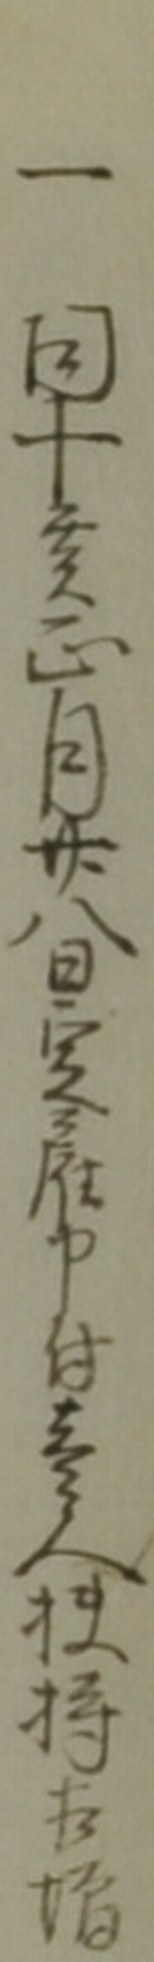一同十亥正月廿八日定雇申付壱人扶持相増
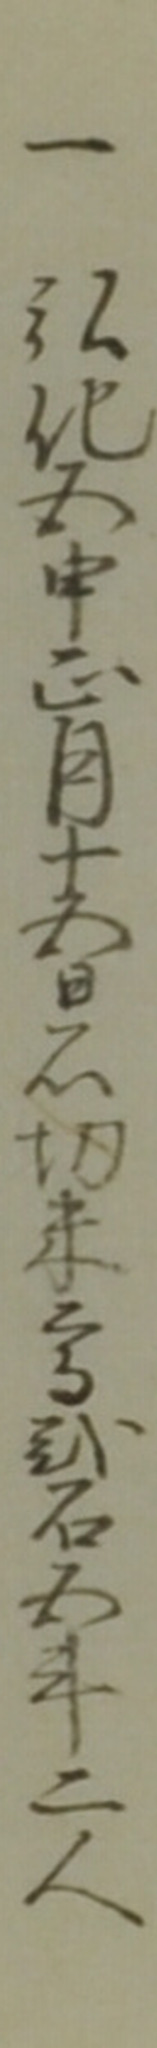一弘化五申正月十五日石切米高弐石五斗二人
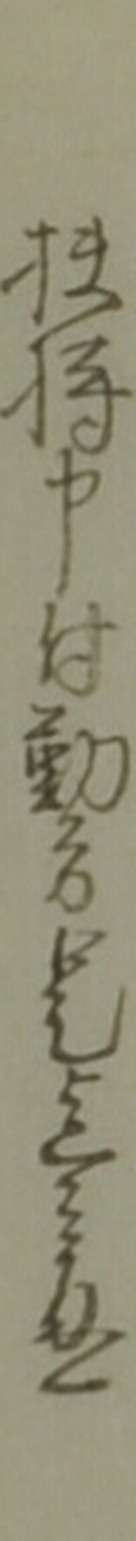扶持申付勤方是迄之通
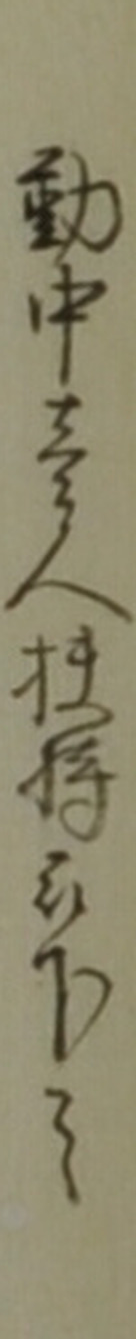勤中壱人扶持被下之

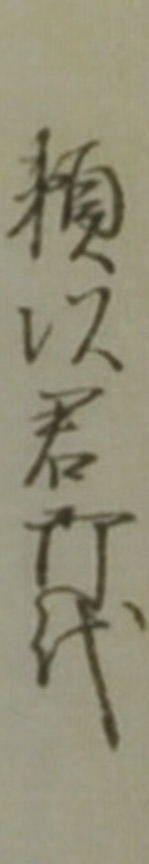頼以君御代
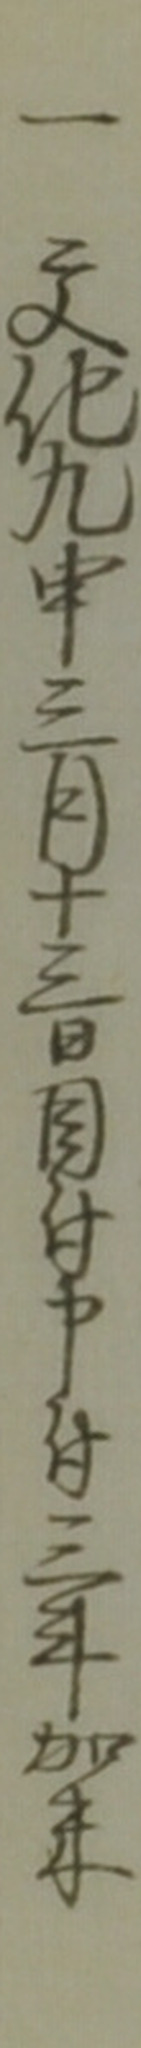一文化九申三月十三日目付申付三斗加米
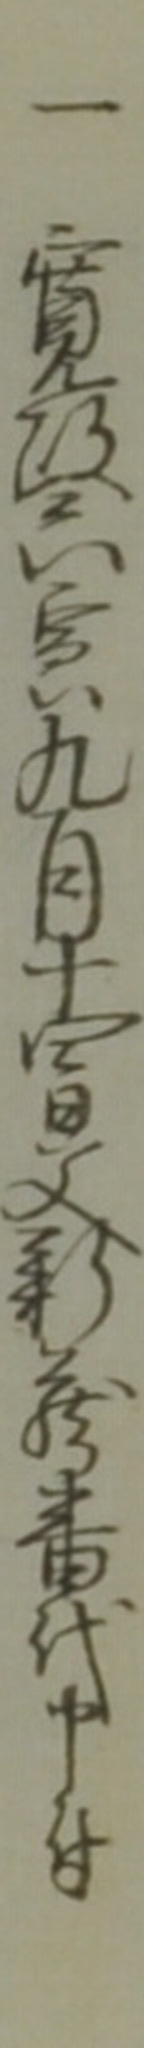一寛政六寅九月十四日父新蔵番代申付
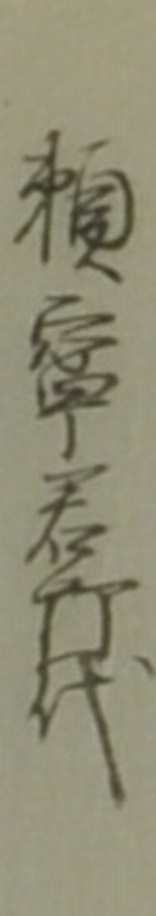頼寧君御代
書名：無足諸士勤仕録（八）
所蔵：伊那市立高遠町図書館・合同会社AMANE
